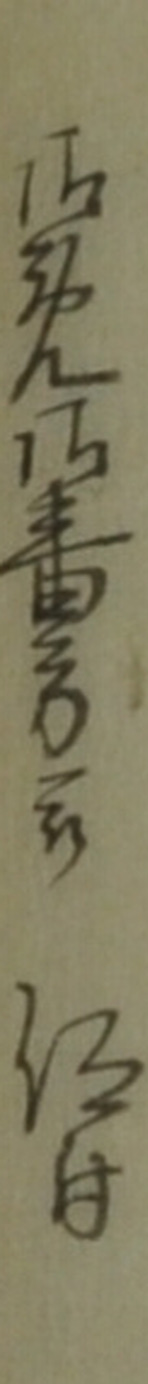御免御番方被仰付
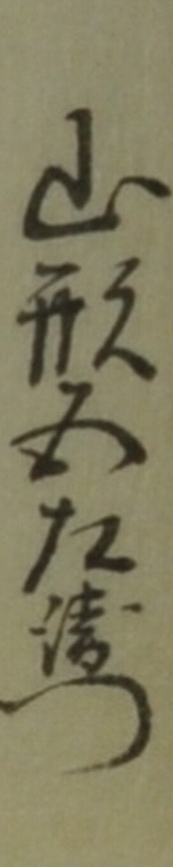山形五左衛門
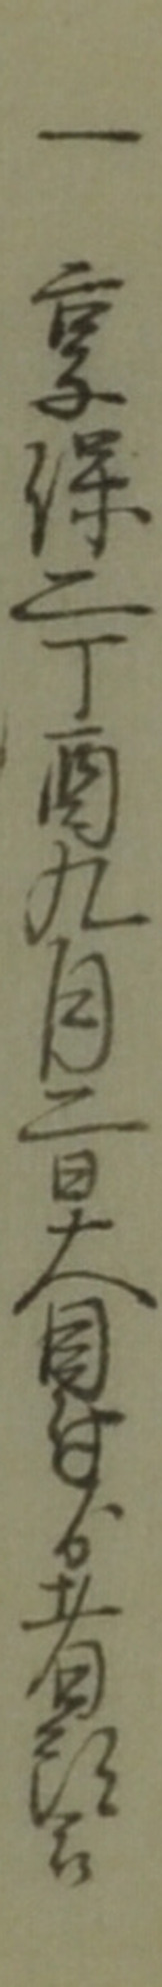一享保二丁酉九月二日大目付ゟ者頭被
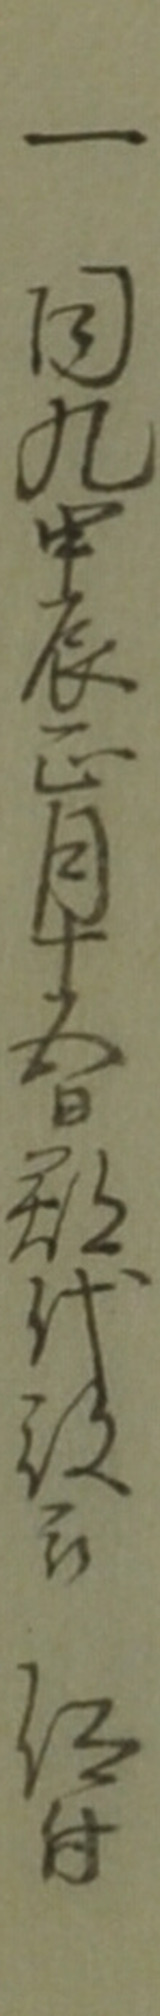一同九甲辰正月十五日郡代役被仰付
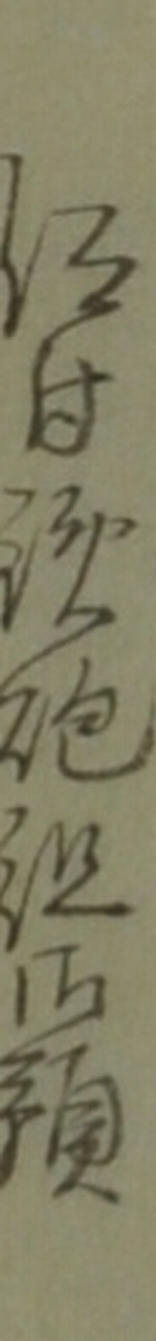被仰付鉄砲組御預
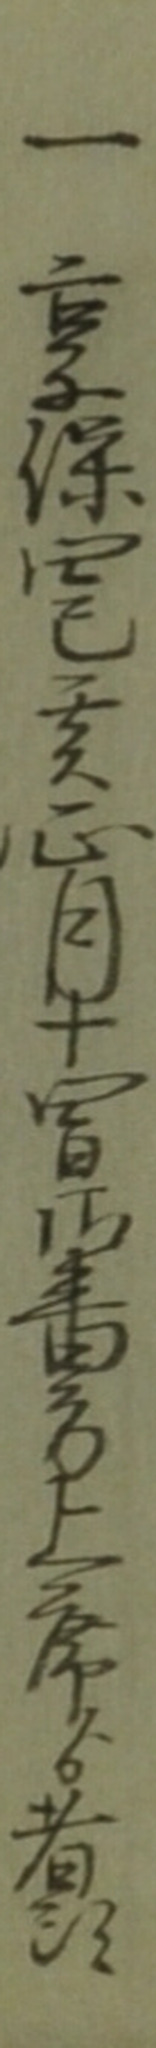一享保四己亥正月十四日御番方上席ゟ者頭
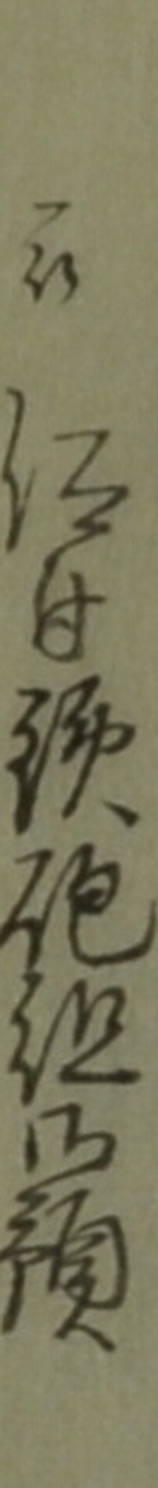被仰付鉄砲組御預
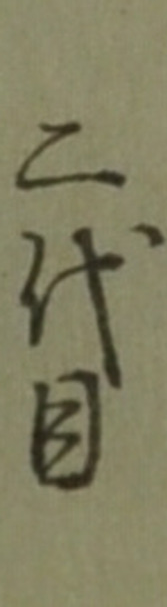二代目
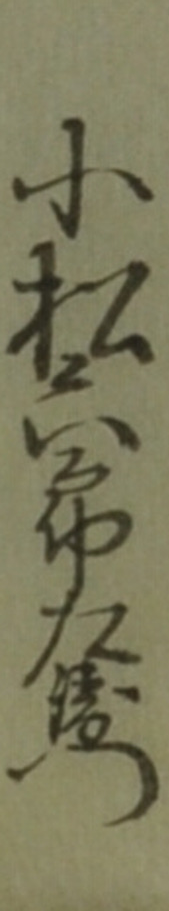小松六郎左衛門
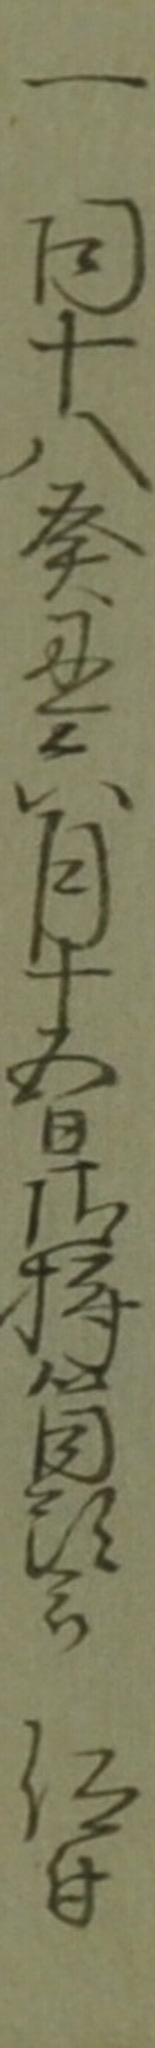一同十八癸丑六月十五日御持筒頭被仰付
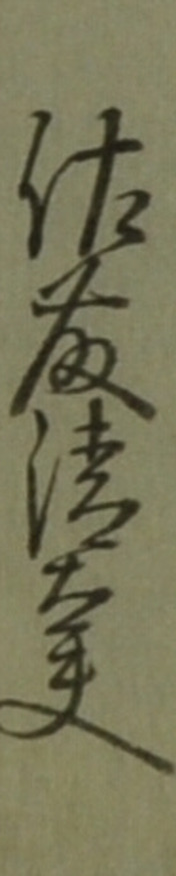佐藤清太夫
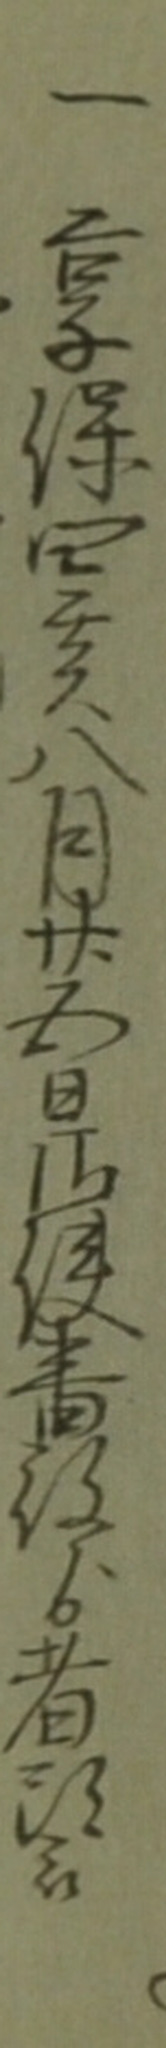一享保四亥八月廿五日御使番役ゟ者頭被
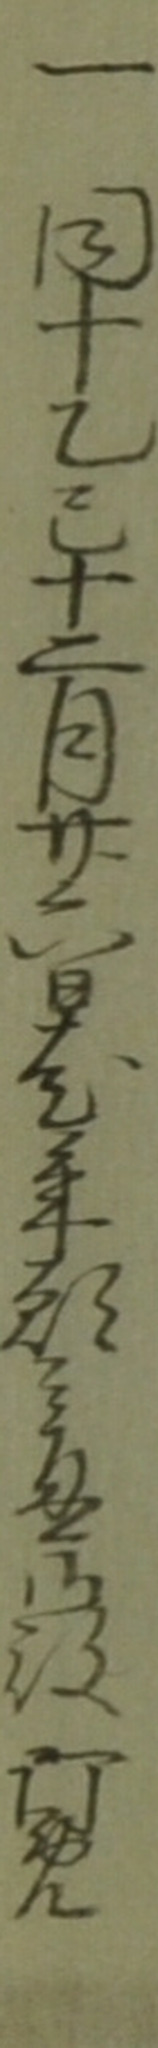一同十乙巳十二月廿六日老年願之通御役御免
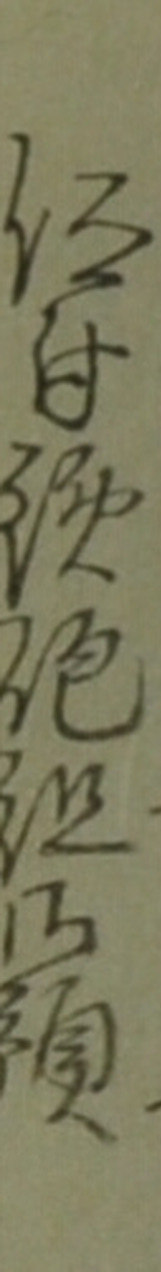被仰付鉄砲組御預

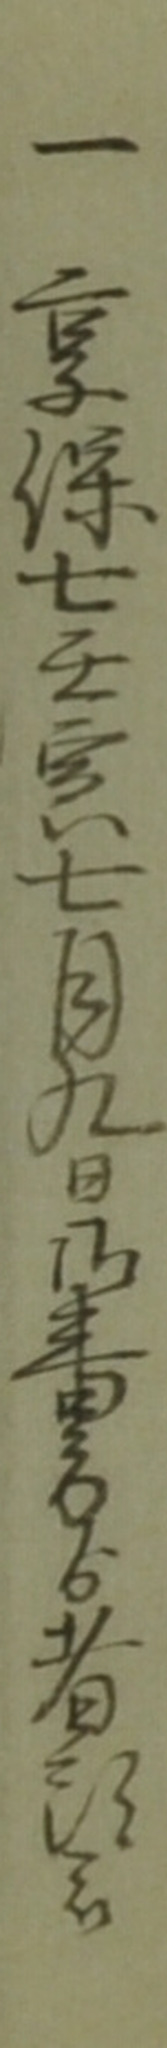一享保七壬寅七月九日御番方ゟ者頭被
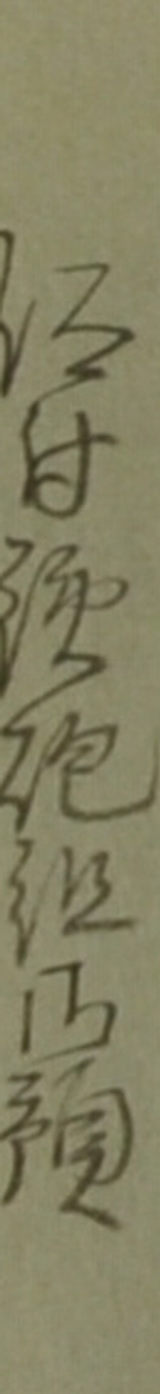仰付鉄砲組御預
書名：諸御役代々録（二）
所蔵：伊那市立高遠町図書館・合同会社AMANE
